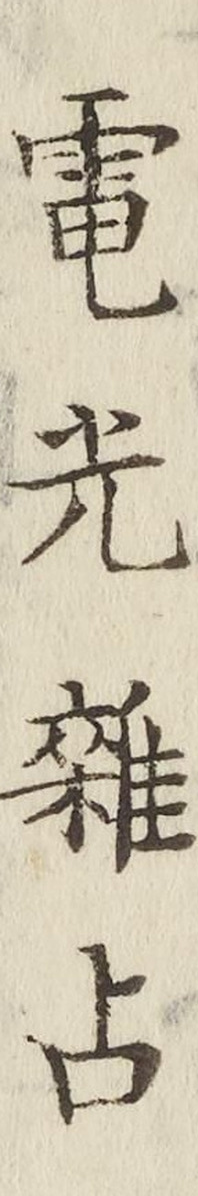電光雑占
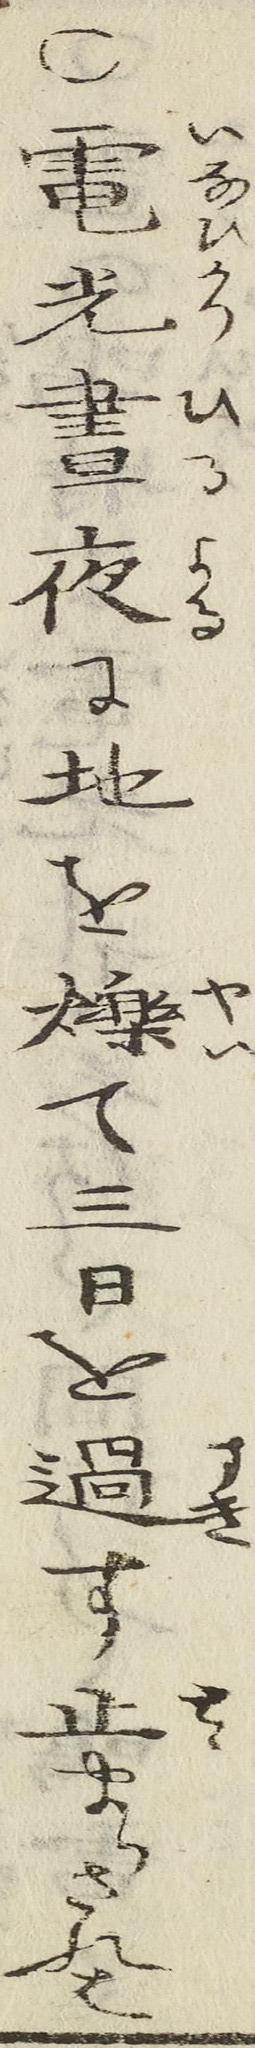○電光昼夜に地を爍て三日を過す止まらされは
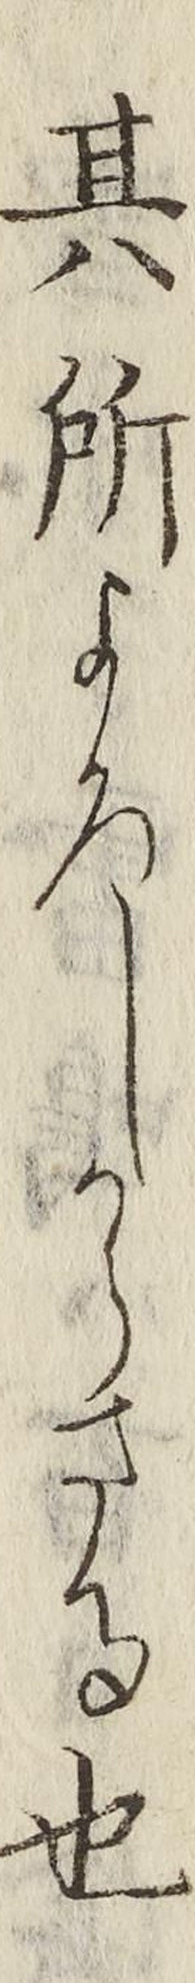其所よろしからさる也
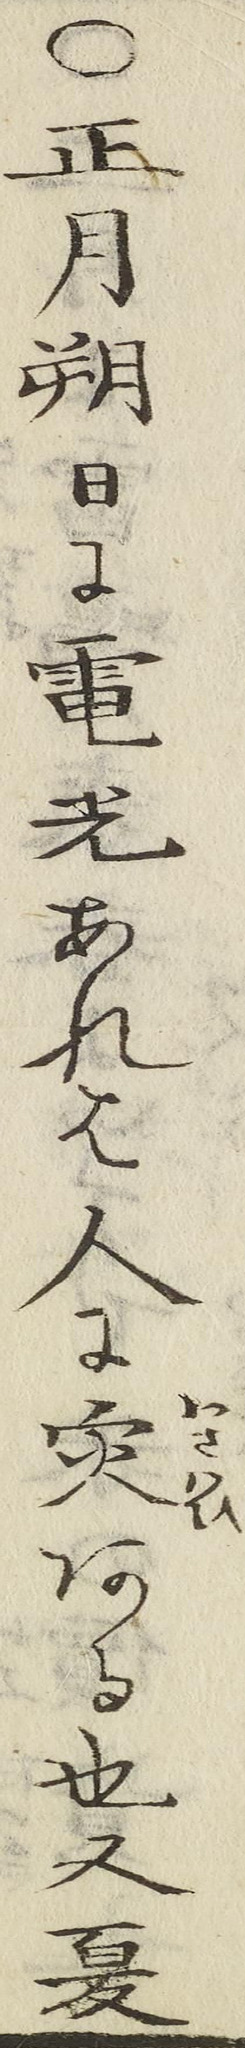○正月朔日に電光あれは人に災ある也又夏
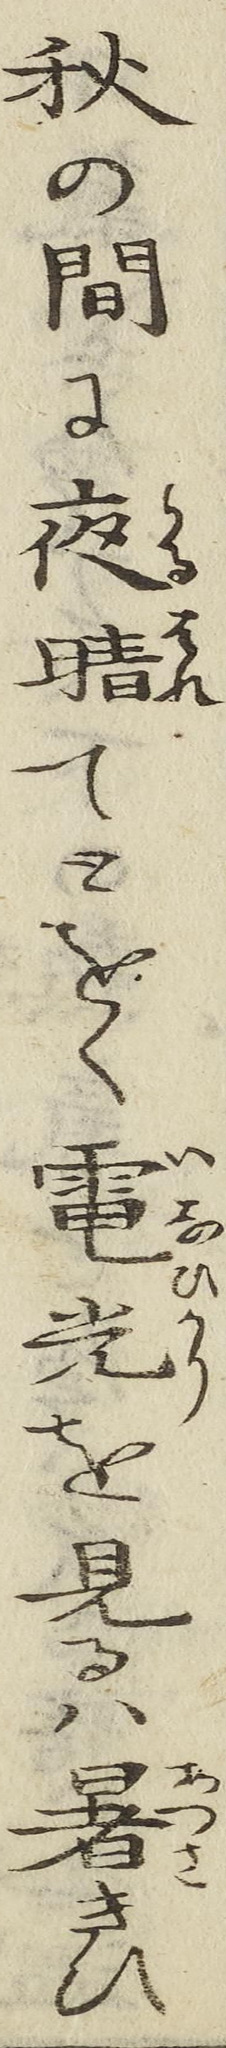秋の間に夜晴てとをく電光を見るは暑きひ
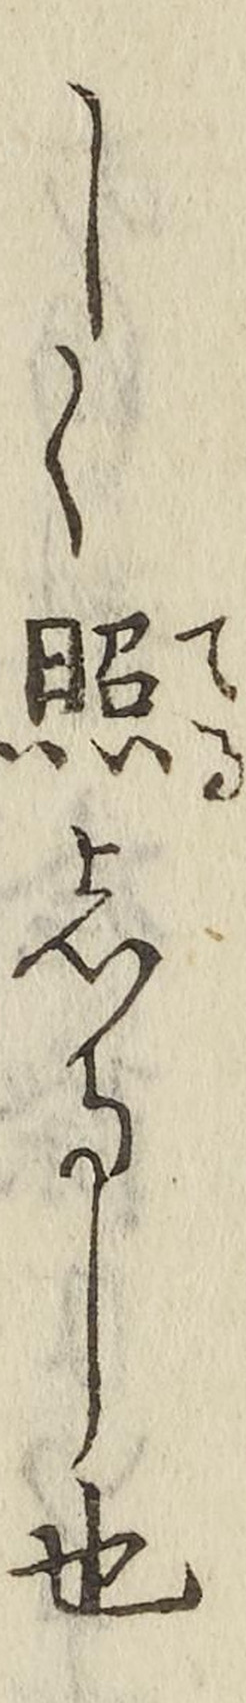しく照しるし也
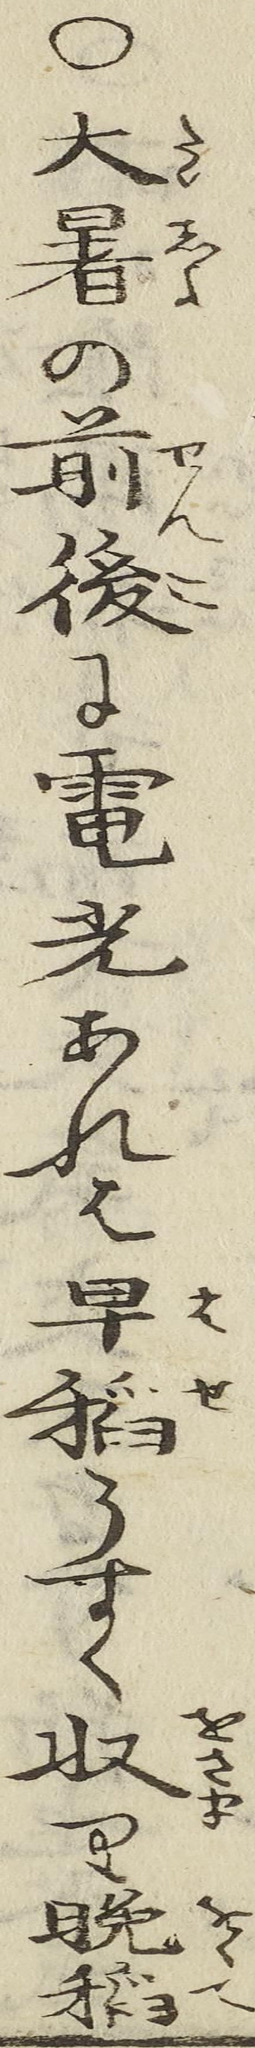○大暑の前後に電光あれは早稲うすく収り晩稲
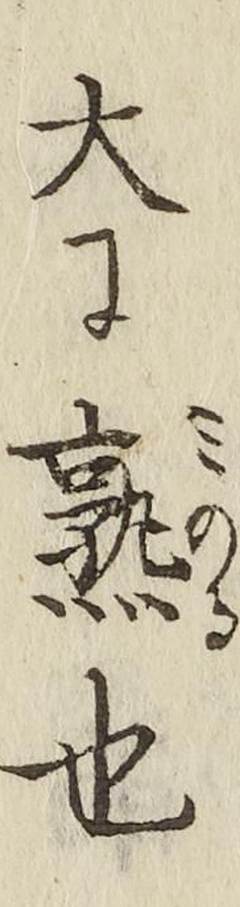大に熟也
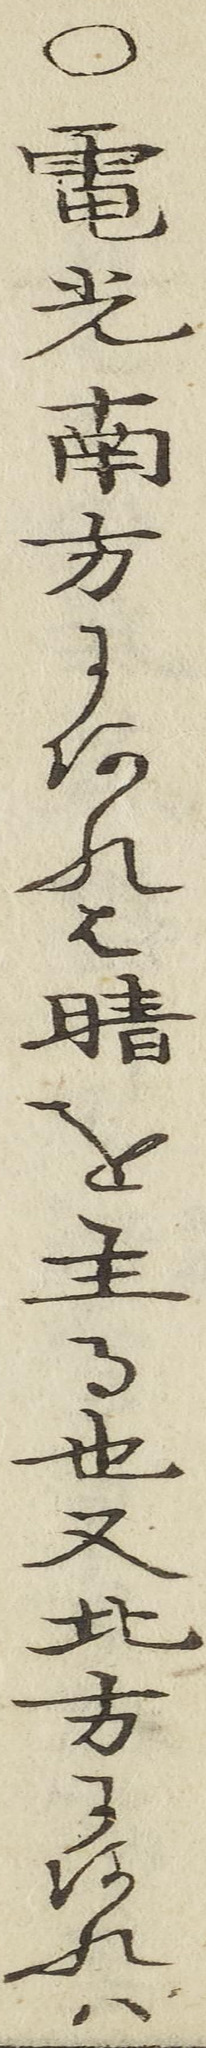○電光南方にあれは晴を主る也北方にあれは
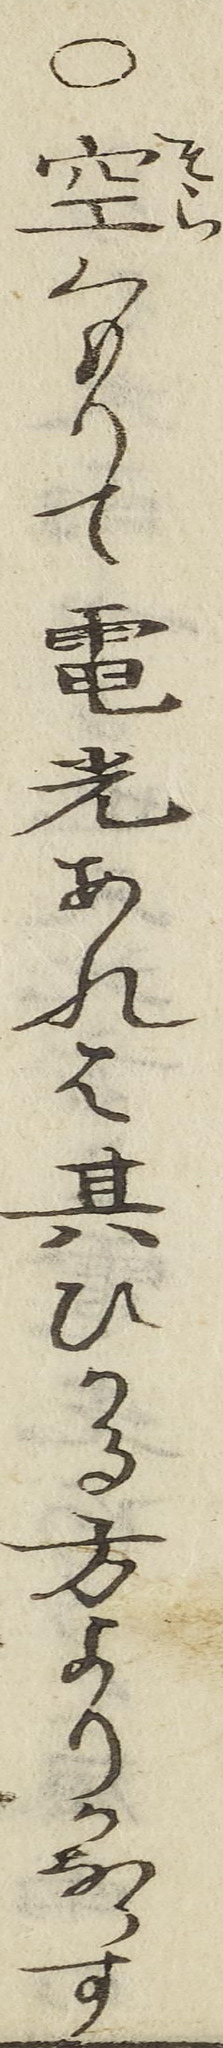○空くもりて電光あれは其ひかる方よりかならす
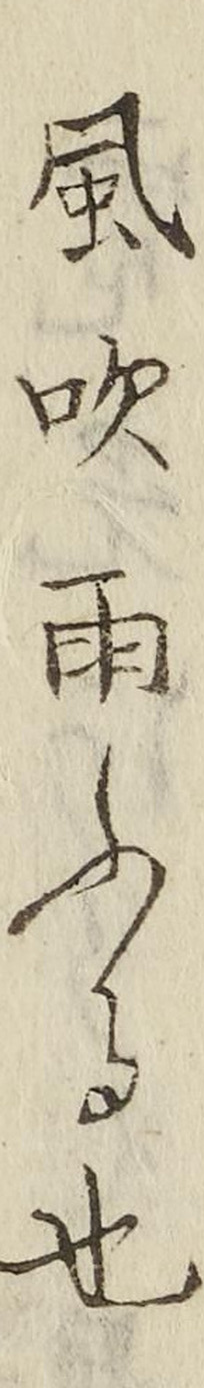風吹雨ふる也
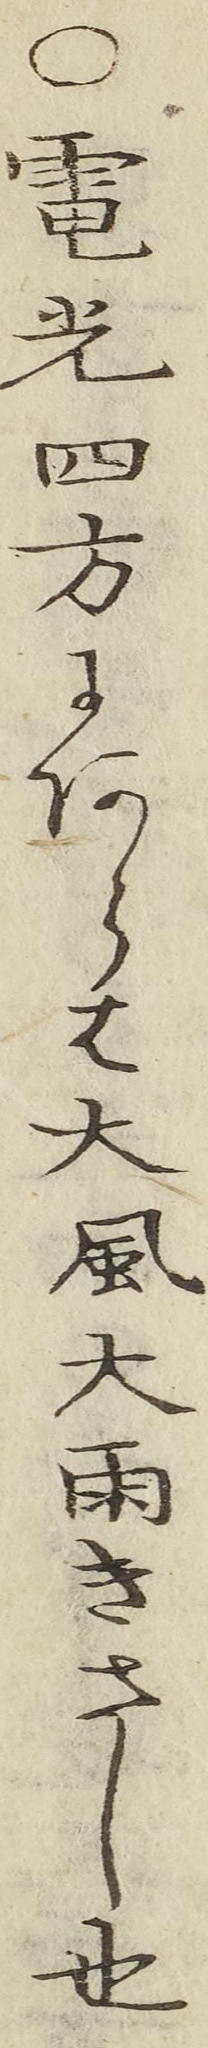○電光四方にあらは大風大雨きさし也
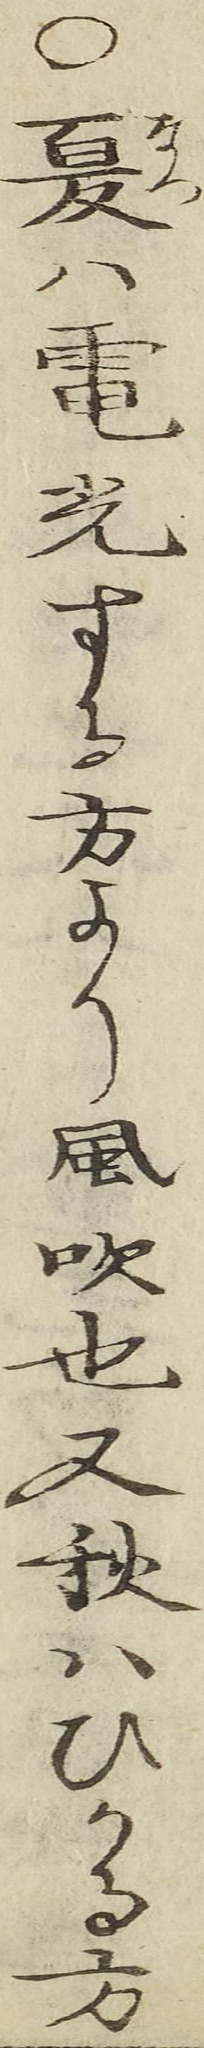○夏は電光する方より風吹也又秋はひかる方

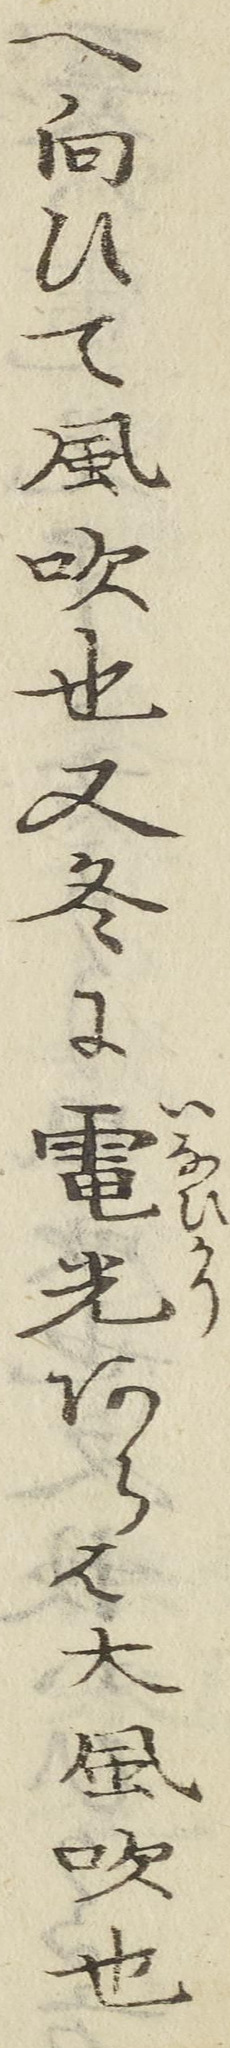へ向ひて風吹く也又冬に電光あらば大風吹也
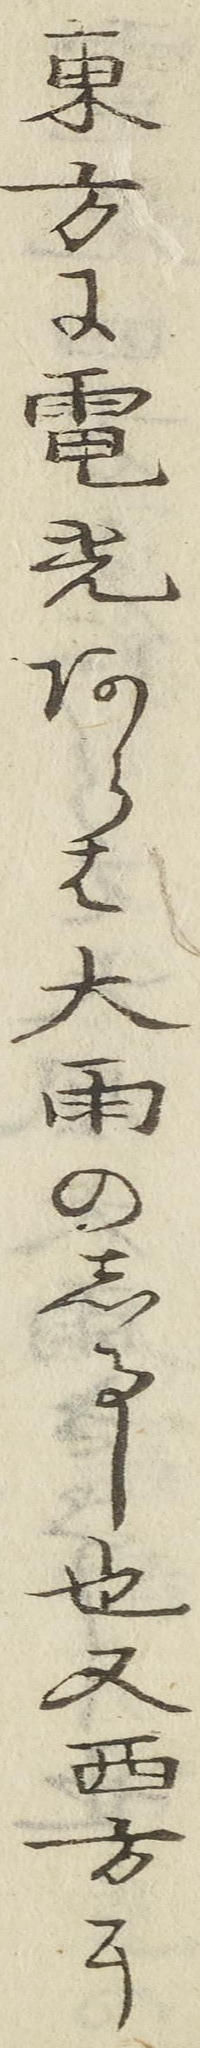東方に電光あらは大雨のしるし也又西方に
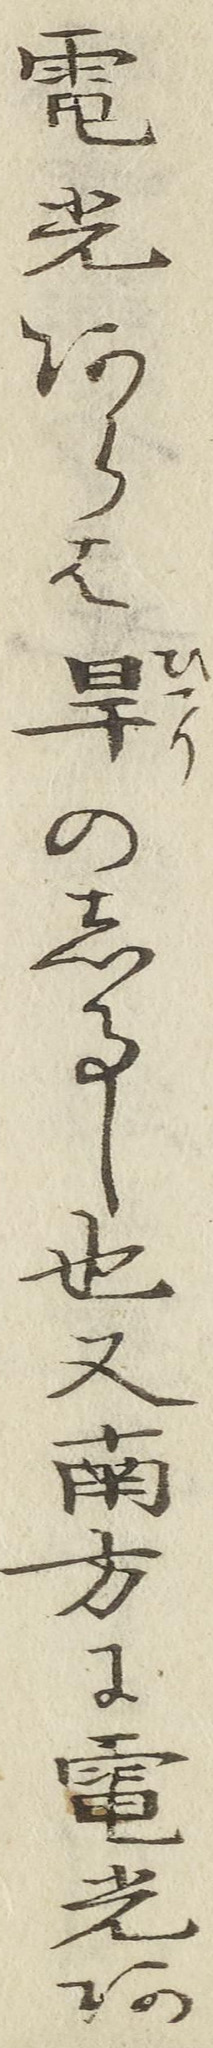電光あらは旱のしるし也又南方に電光あ
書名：天時占候　二
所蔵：東京大学地震研究所図書室 Earthquake Research Institute Library, The University of Tokyo, JAPAN
